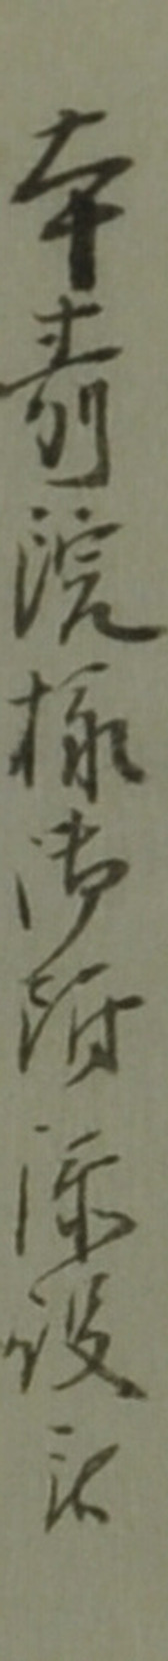本寿院様御附添役被
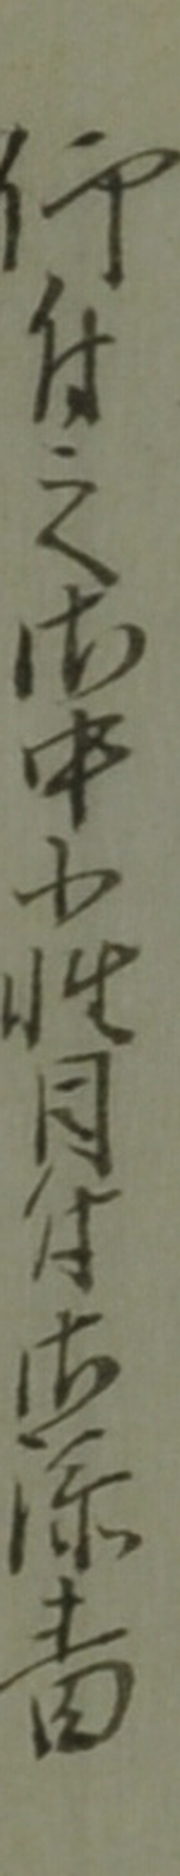仰付之御中小性目付御添番
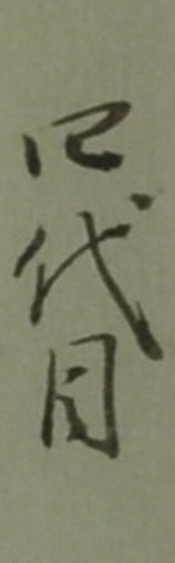四代目
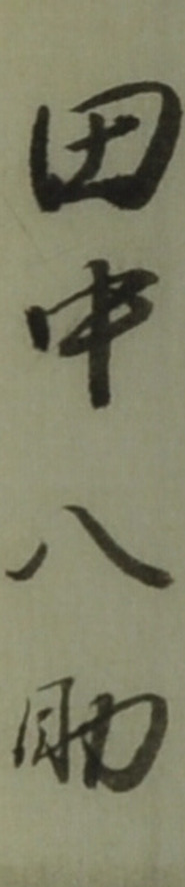田中八助

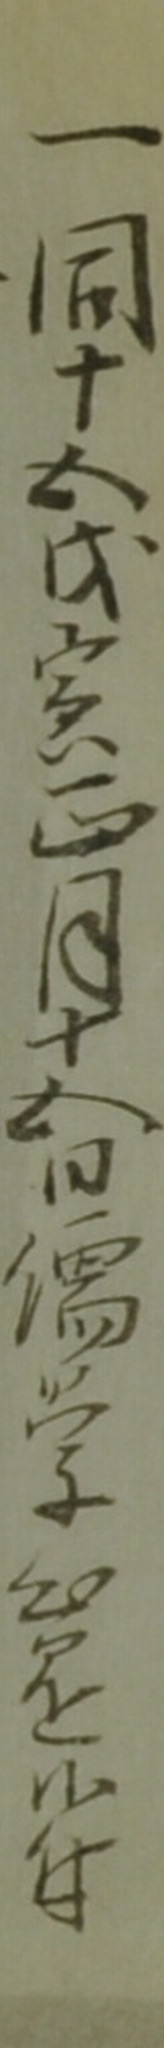一同十五戌寅正月十五日儒学心懸候付
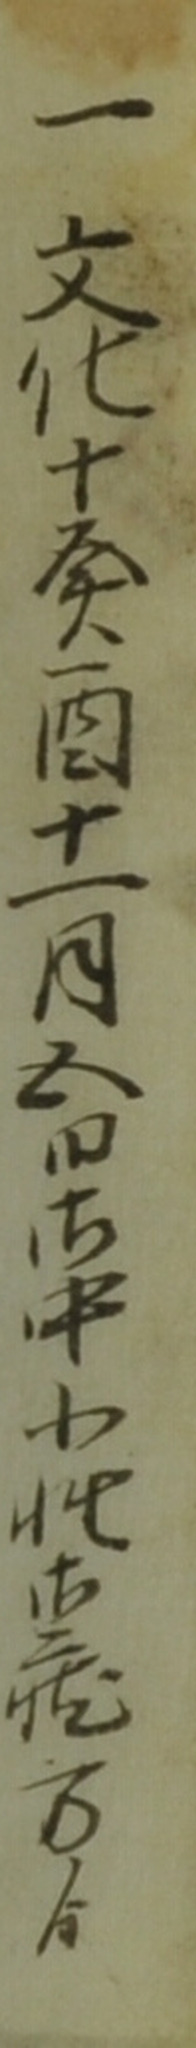一文化十癸酉十一月五日御中小姓御蔵方より
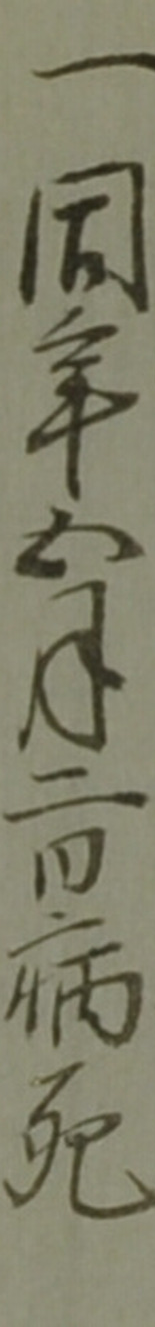一同年五月二日病死
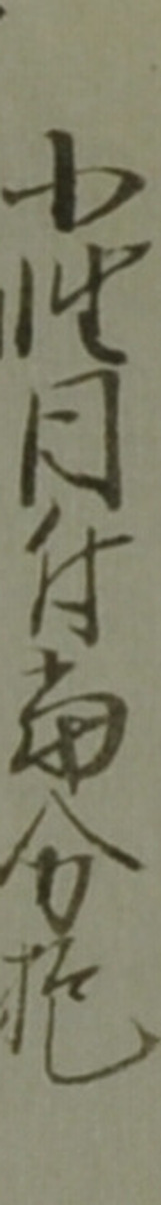小姓目付当分抱
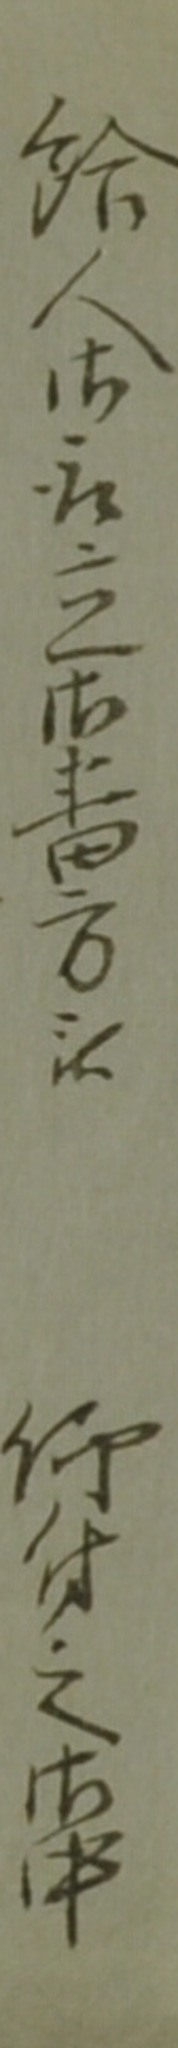給人御取立御番方被仰付之御中
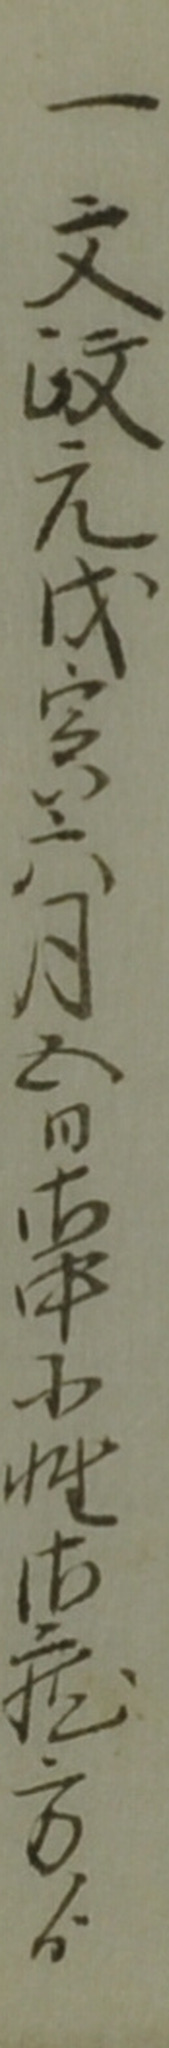一文政元戊寅六月五日御中小姓御蔵方より
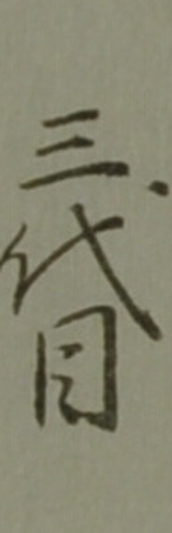三代目
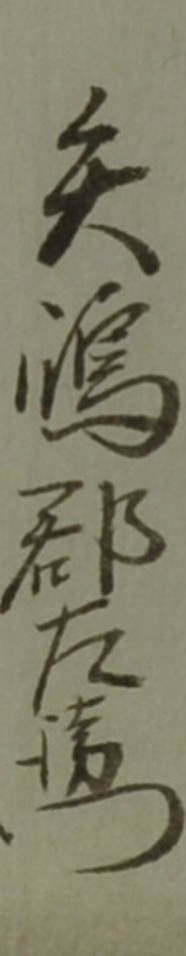矢嶋郡左衛門
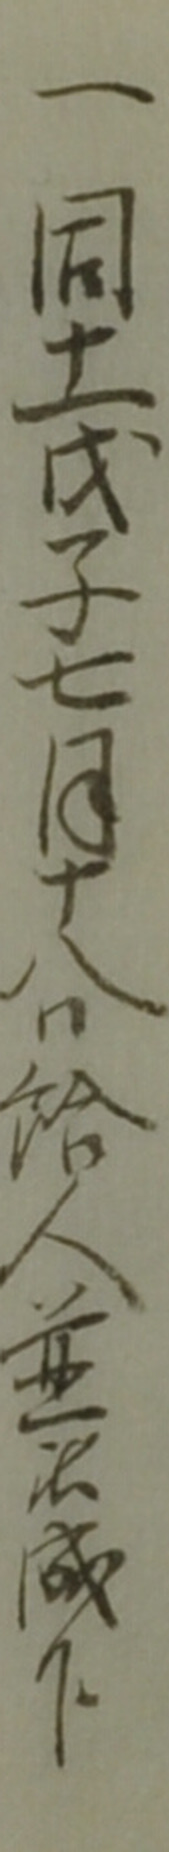一同十一戊子七月十八日給人並被成下
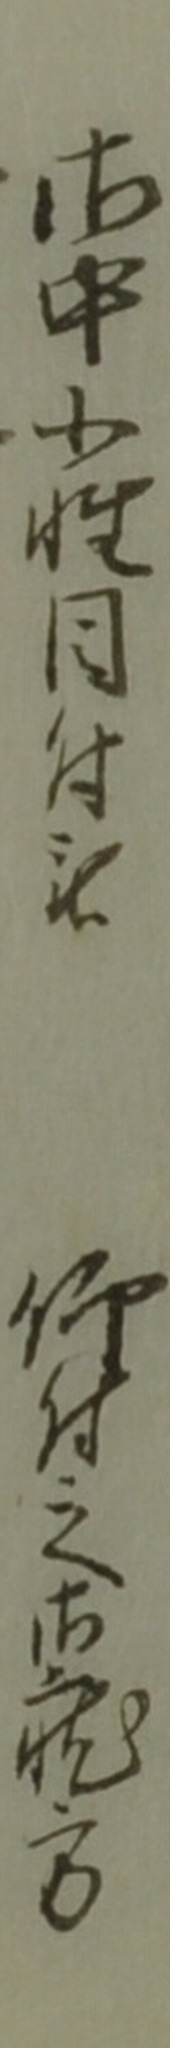御中小姓目付被仰付之御蔵方
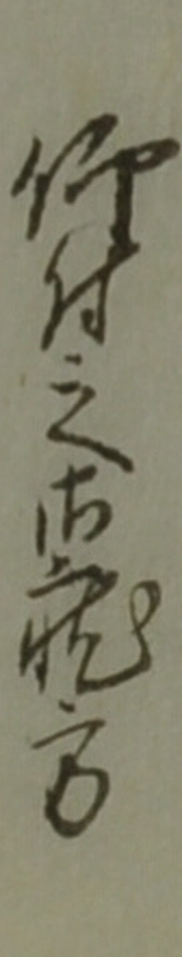仰付之吟味方
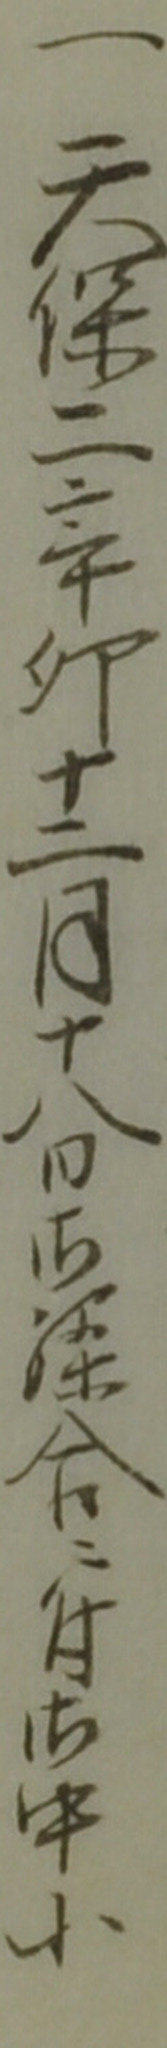一天保二辛卯十二月十八日御繰合ニ付御中小
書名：諸御役代々録（八）
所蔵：伊那市立高遠町図書館・合同会社AMANE
